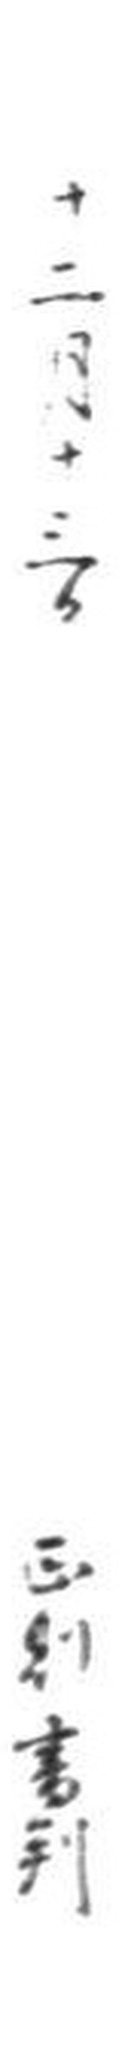十二月十三日正則書判
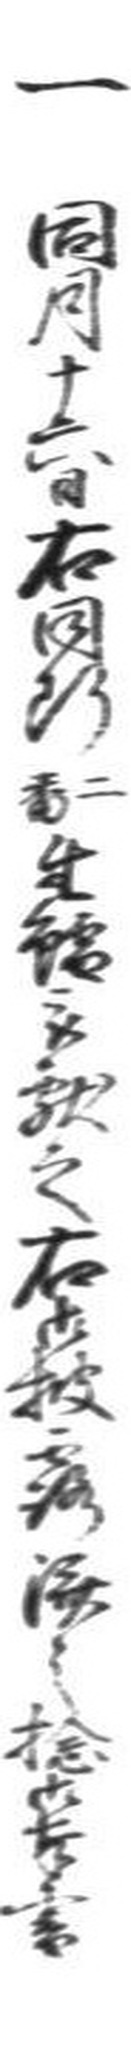一同月十六日右同断二番生鱈被献之右御披露済之捻御奉書
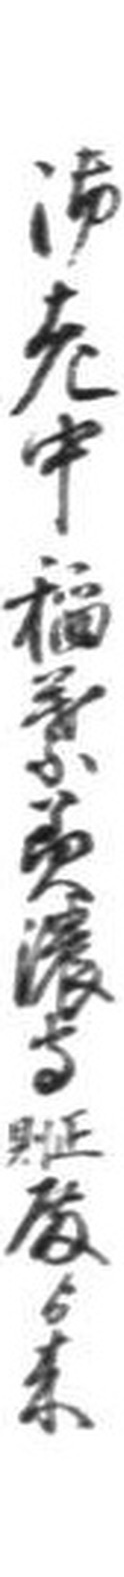御老中稲葉美濃守正則殿ゟ来
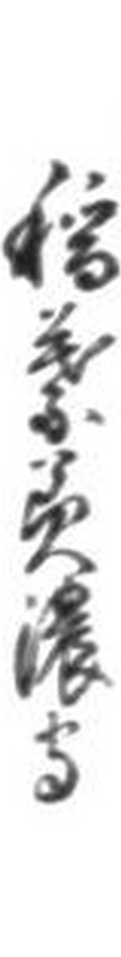稲葉美濃守

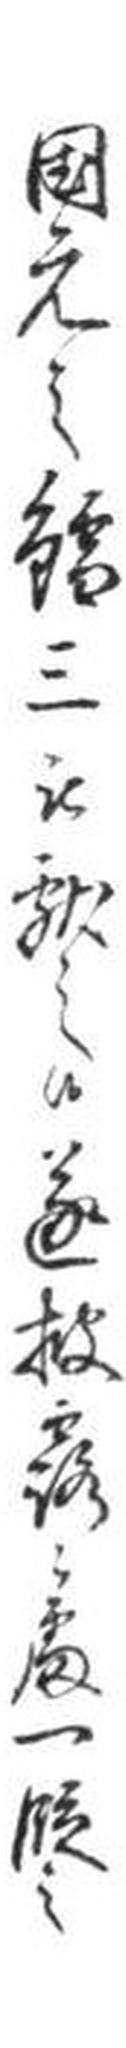国元之鱈三被献之候遂披露候処一段之
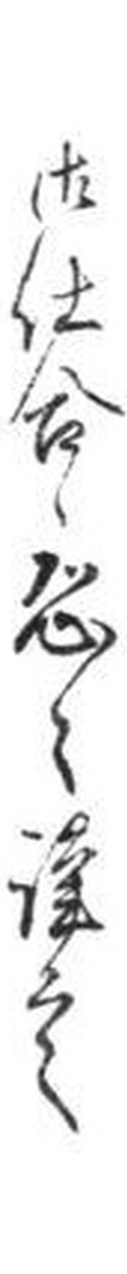御仕合候恐々謹言
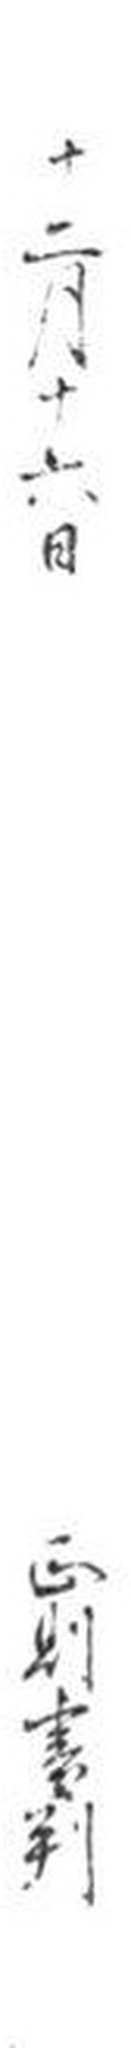十二月十六日正則書判
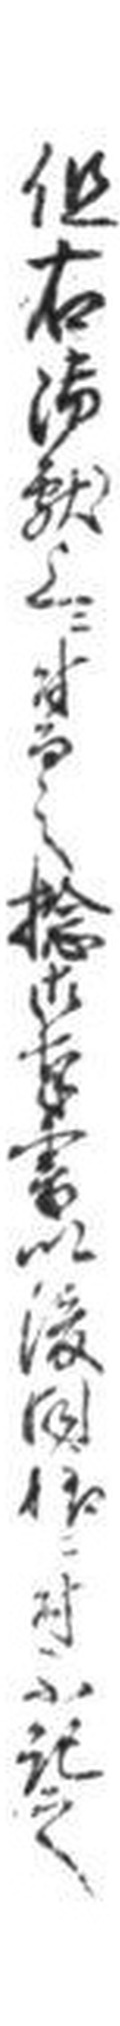但右御献上ニ付而之捻御奉書以後同様ニ付不記之
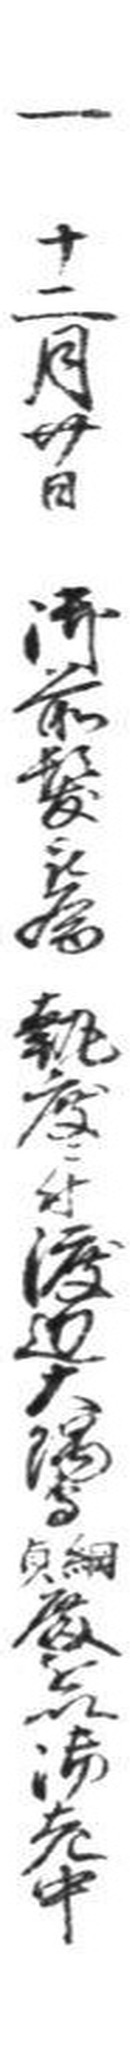一十二月廿日御前髪被為執度ニ付渡辺大隅守綱貞殿を以御老中
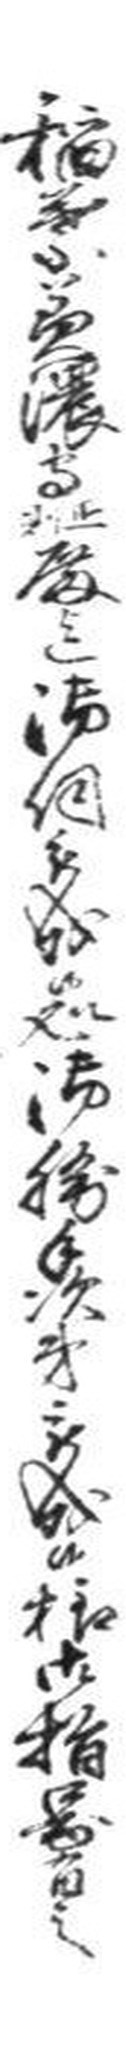稲葉美濃守正則殿迄御伺被成候処御勝手次第被成候様御指図有之
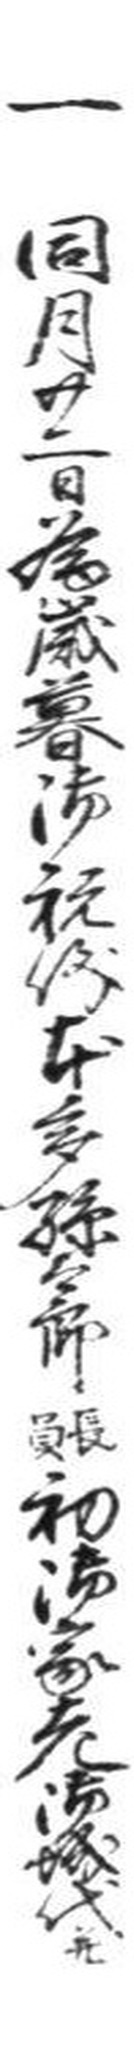一同月廿二日為歳暮御祝儀本多孫太郎長員初御家老御城代并
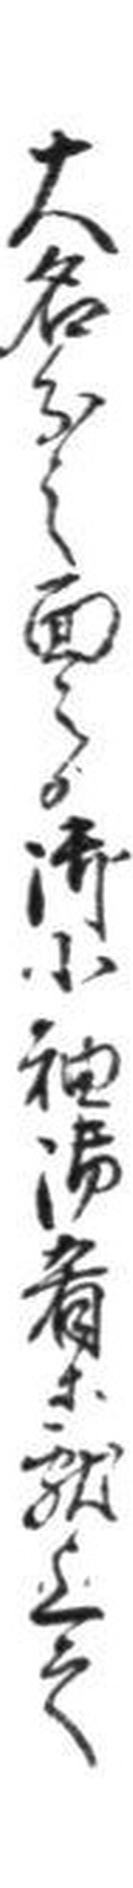大名分之面々ゟ御小袖御肴等献上之
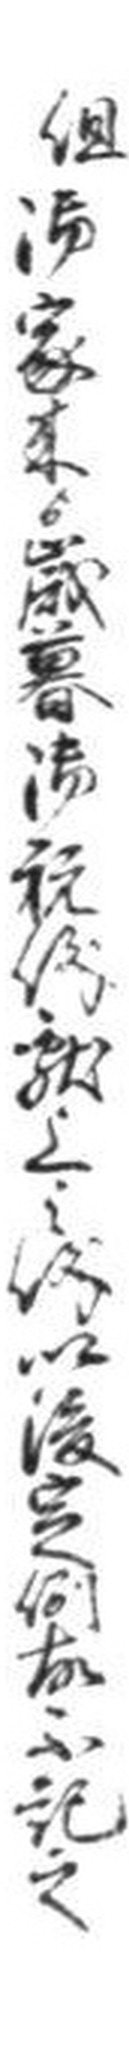但御家来ゟ歳暮御祝儀献上之儀以後定例故不記之
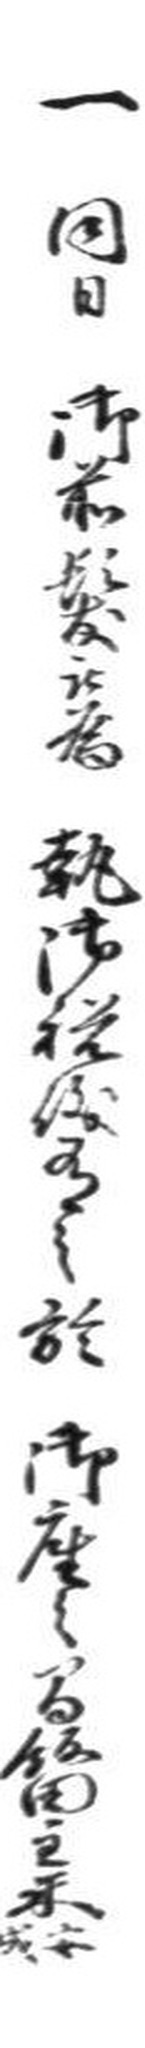一同日御前髪被為執御祝儀有之於御座之間飯田主米安成
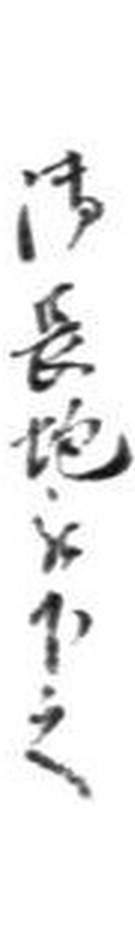御長蚫被下之
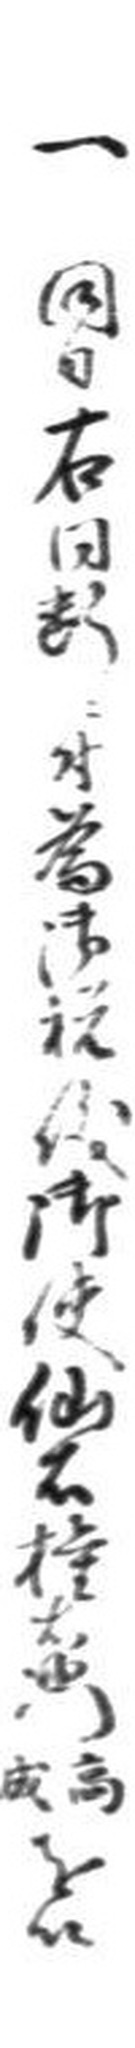一同日右同断ニ付為御祝儀御使仙石権右衛門高成を以
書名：家譜 十三 綱昌公 従寛文元年到延宝五年
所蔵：福井県文書館 Fukui Prefectural Archives
